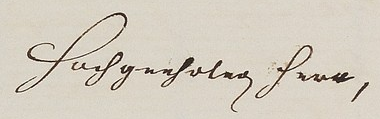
Hochgeehrter Herr,
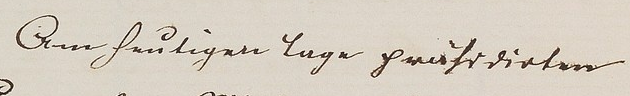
Am heutigen Tage präsidirten
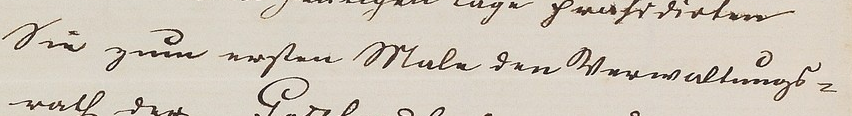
Sie zum ersten Male den Verwaltungs-
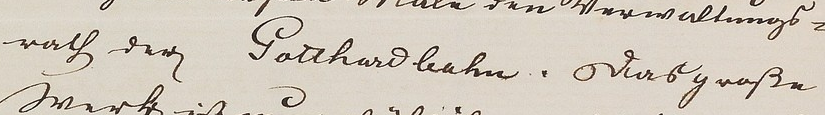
rath der Gotthardbahn. Das große
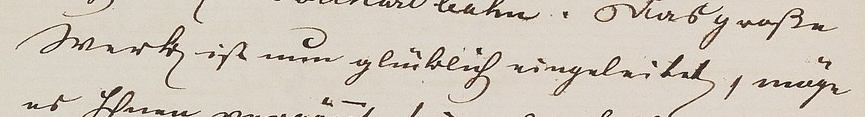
Werk ist nun glücklich eingeleitet, möge
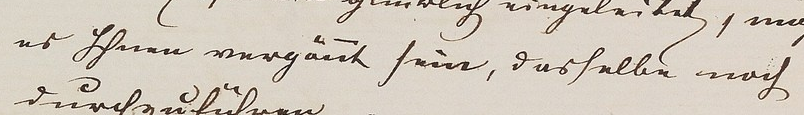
es Ihnen vergönnt sein, dasselbe noch
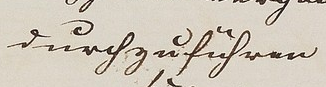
durchzuführen.
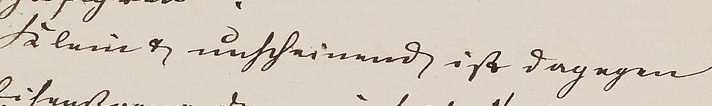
Klein & unscheinend ist dagegen
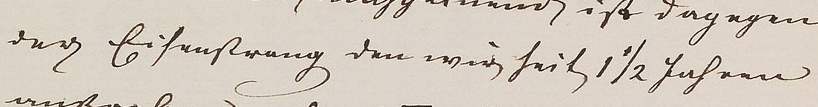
der Eisenstrang den wir seit 1½ Jahren
